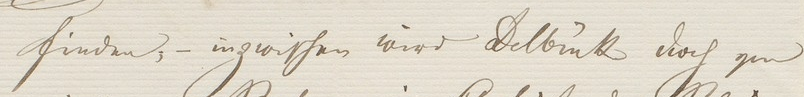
finden; – inzwischen wird Delbrük doch von
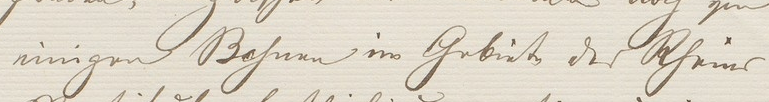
einigen Bahnen ins Gebiet des Rheins
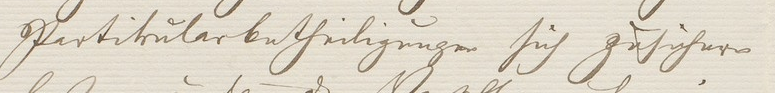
Partikularbetheiligungen sich zusichern
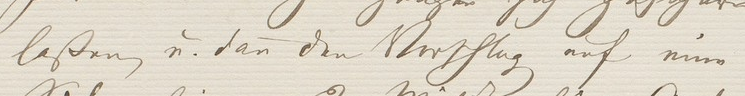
laßen u. dann den Vorschlag auf eine
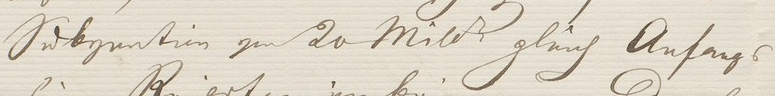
Subvention zu 20 Millionen gleich Anfangs
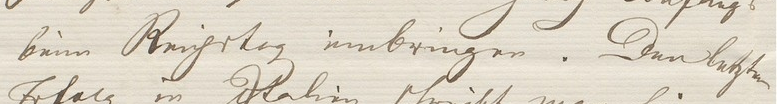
beim Reichstag einbringen. Den letzten
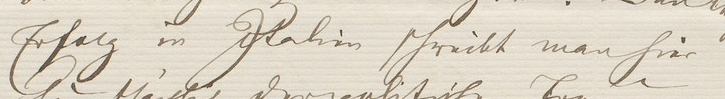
Erfolg in Italien schreibt man hier
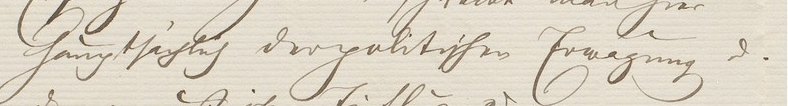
hauptsächlich der politischen Erwägung u.
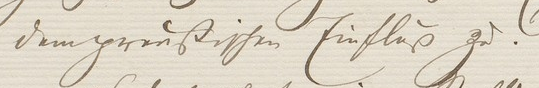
dem preußischen Einfluß zu.
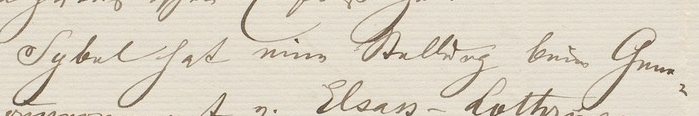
Sybel hat eine Stellung beim Gene-
